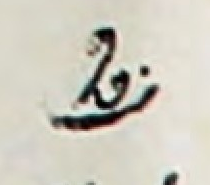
2.
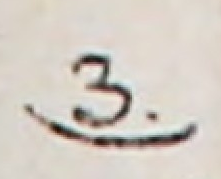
3.
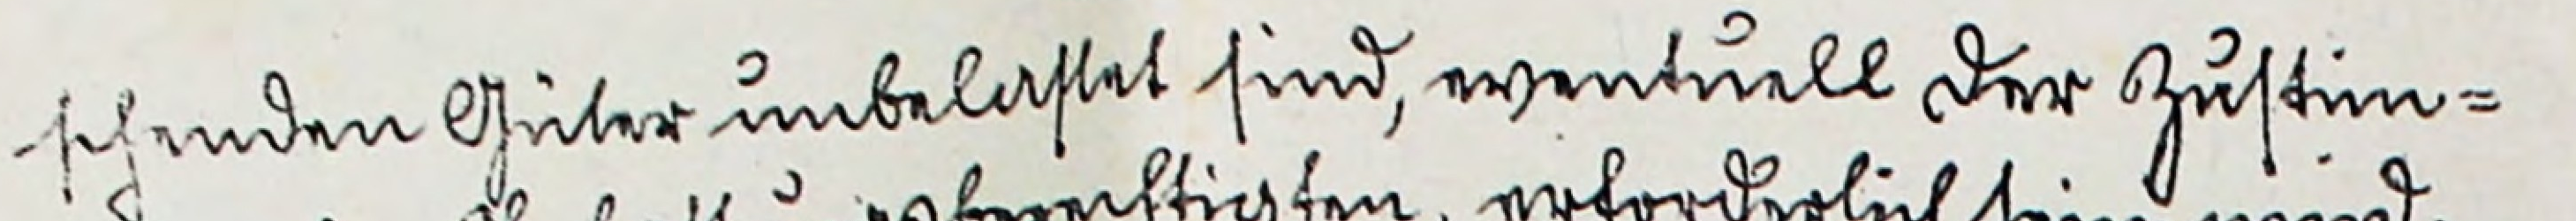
schenden Güter unbelastet sind, eventuell der Zustim=
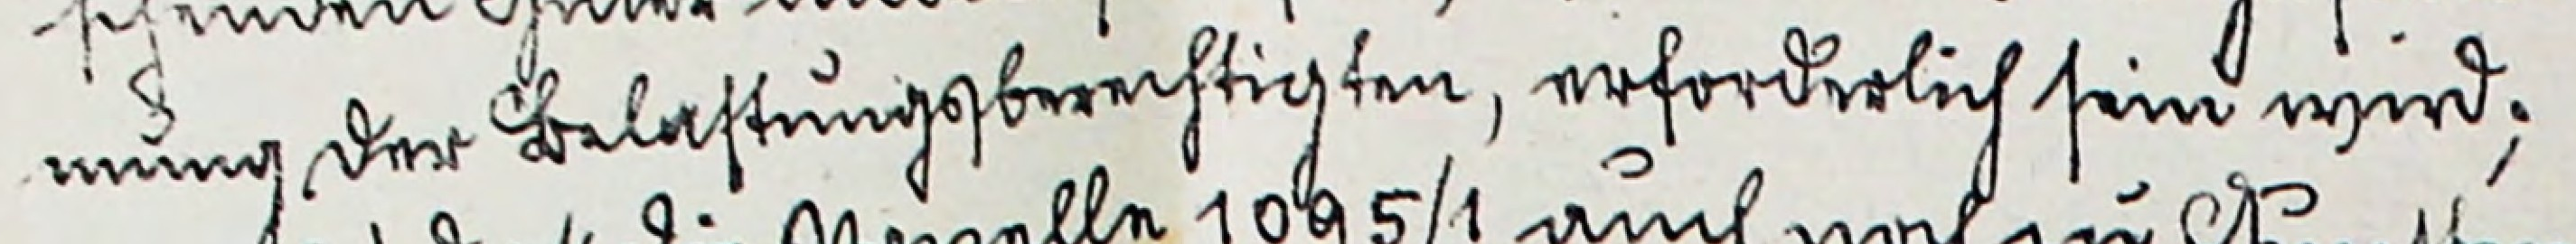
mung der Belastungsberechtigten, erforderlich sein wird;
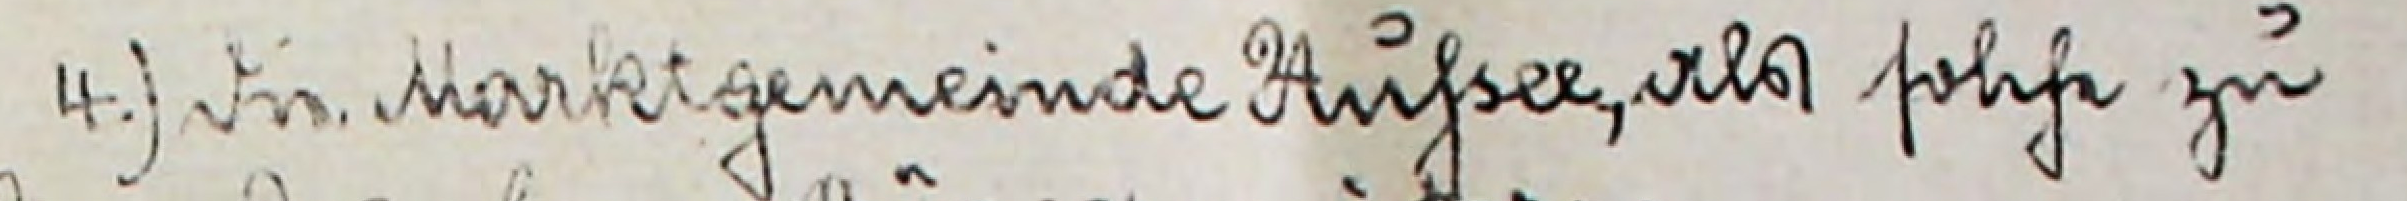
4.) Die Marktgemeinde Aussee, als solche zu
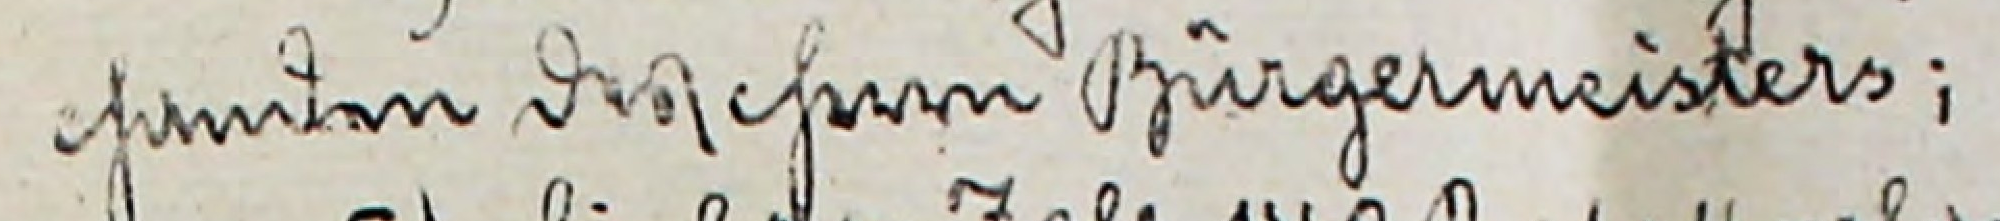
Handen des Herrn Bürgermeisters;
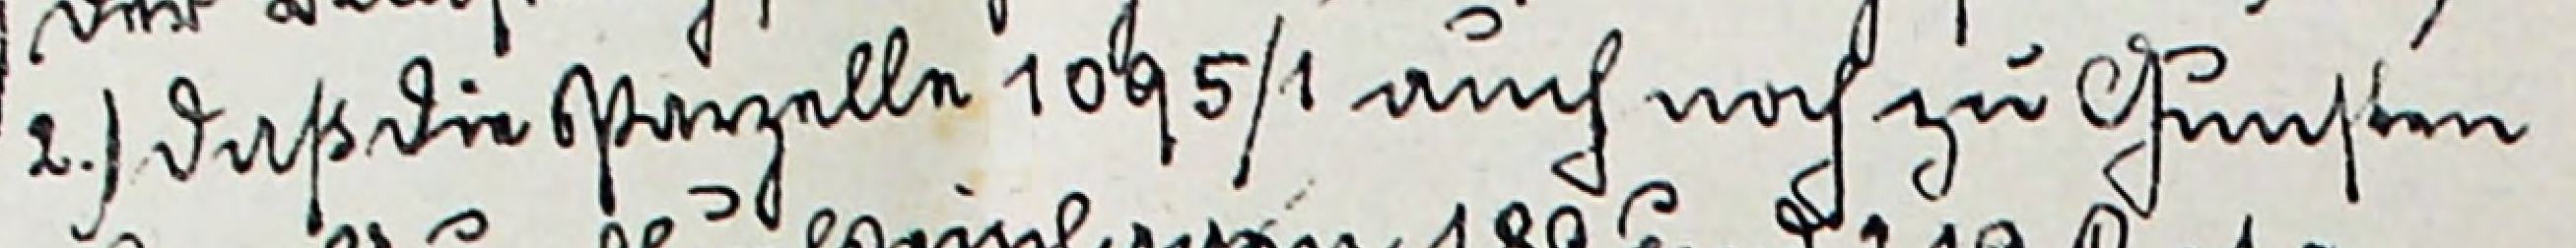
2.) Daß die Parzelle 1095/1 auch noch zu Gunsten
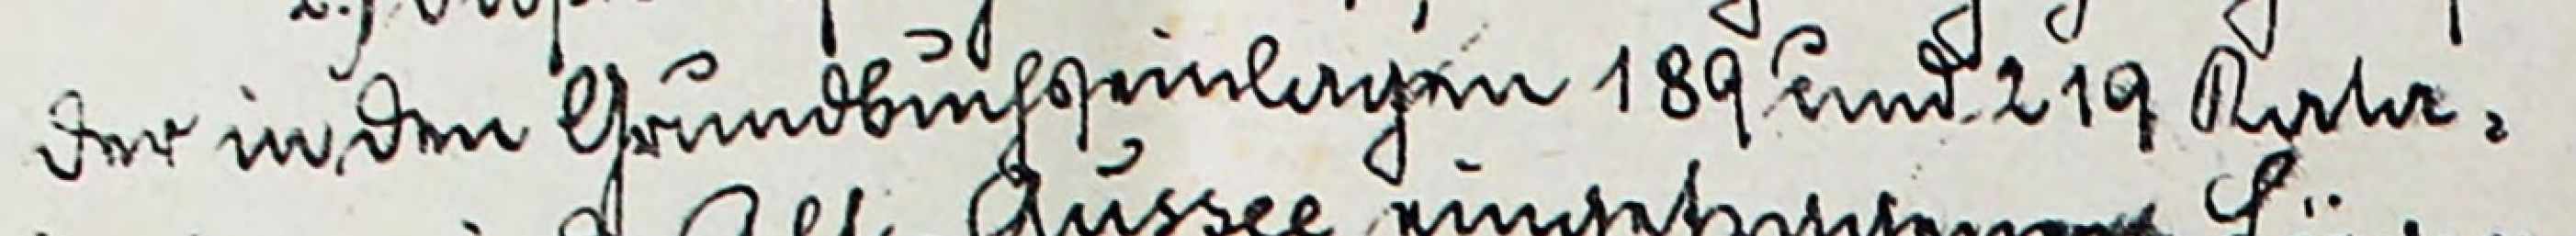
der in den Grundbuchseinlagen 189 und 219 Kata=
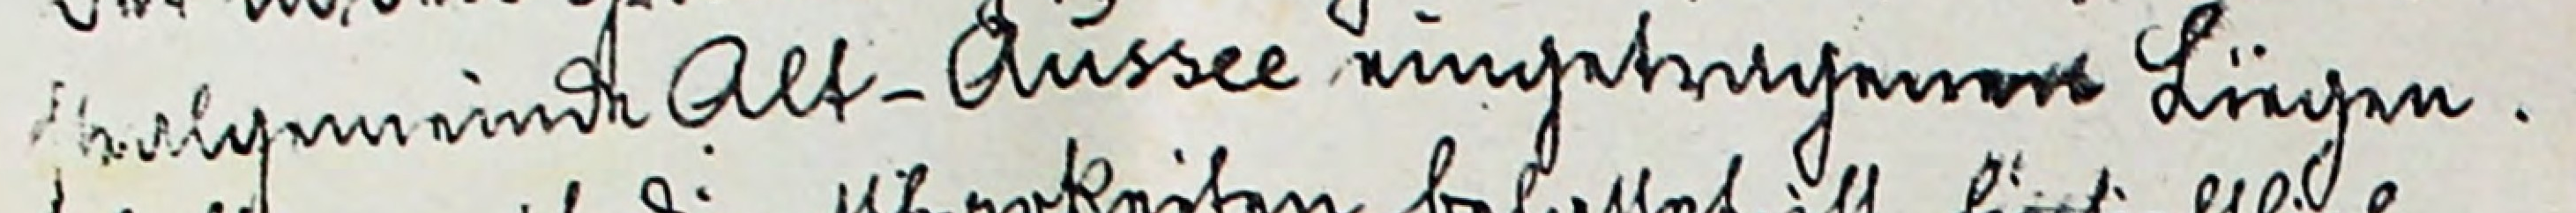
stralgemeinde Alt - Aussee eingetragenen Lügen.
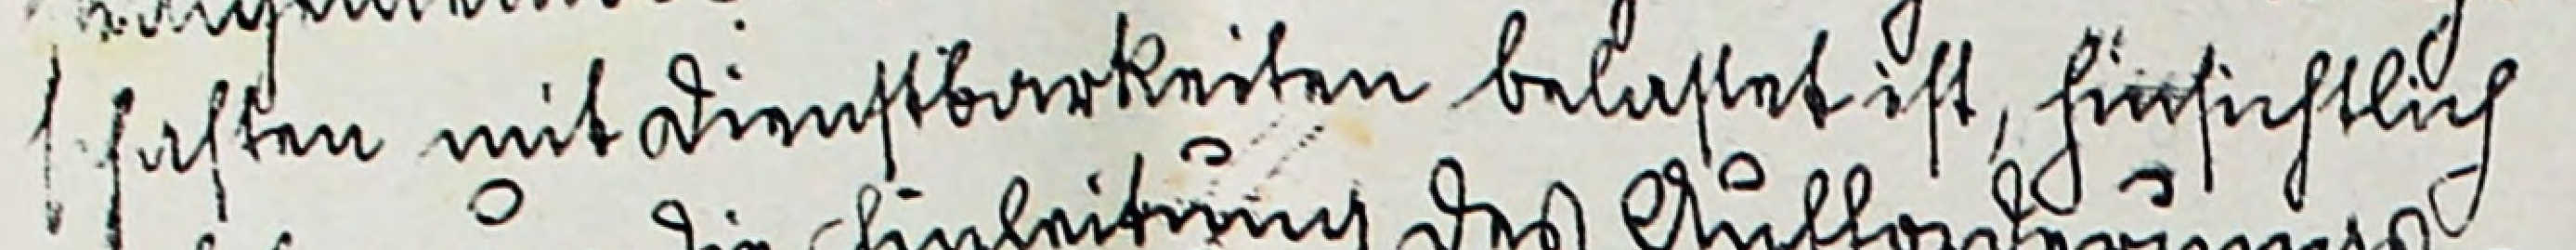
schaften mit Dienstbarkeiten belastet ist, hinsichtlich
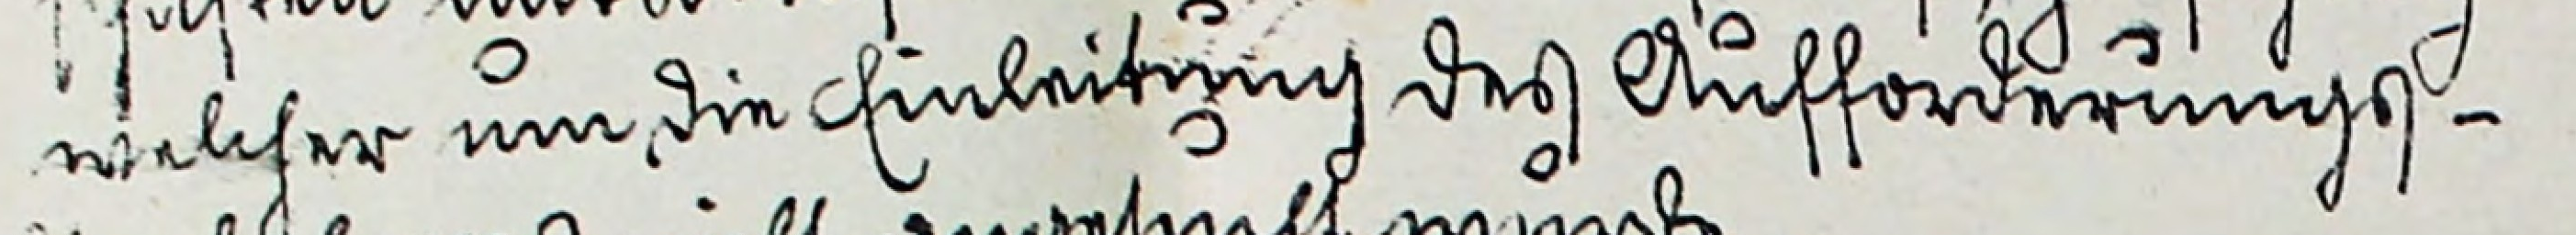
welcher um die Einleitung des Aufforderungs -
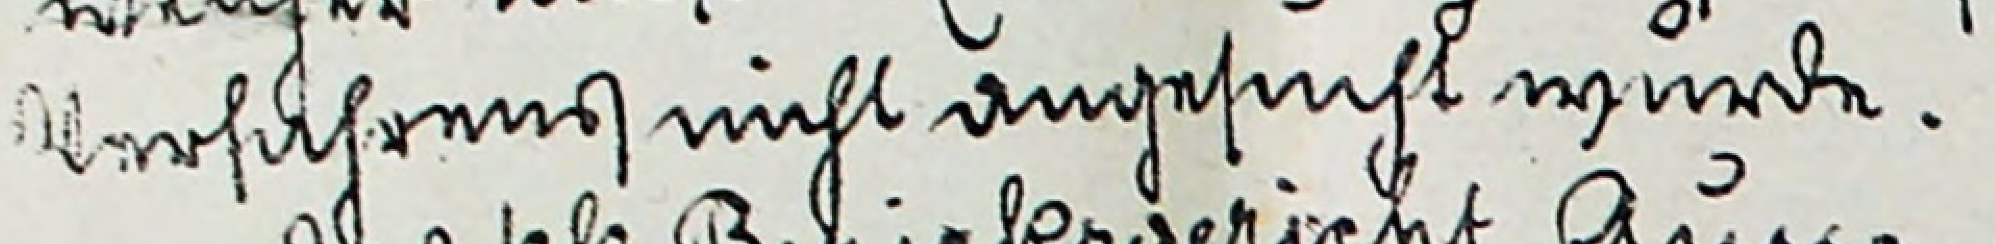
Verfahrens nicht angesucht wurde.
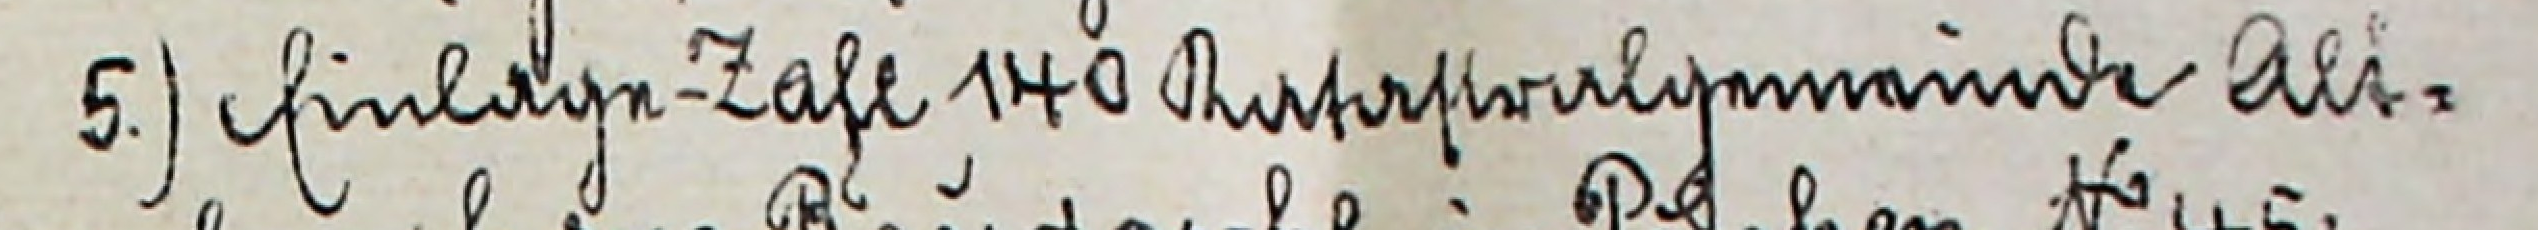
5.) Einlage - Zahl 140 Katastralgemeinde Alt=
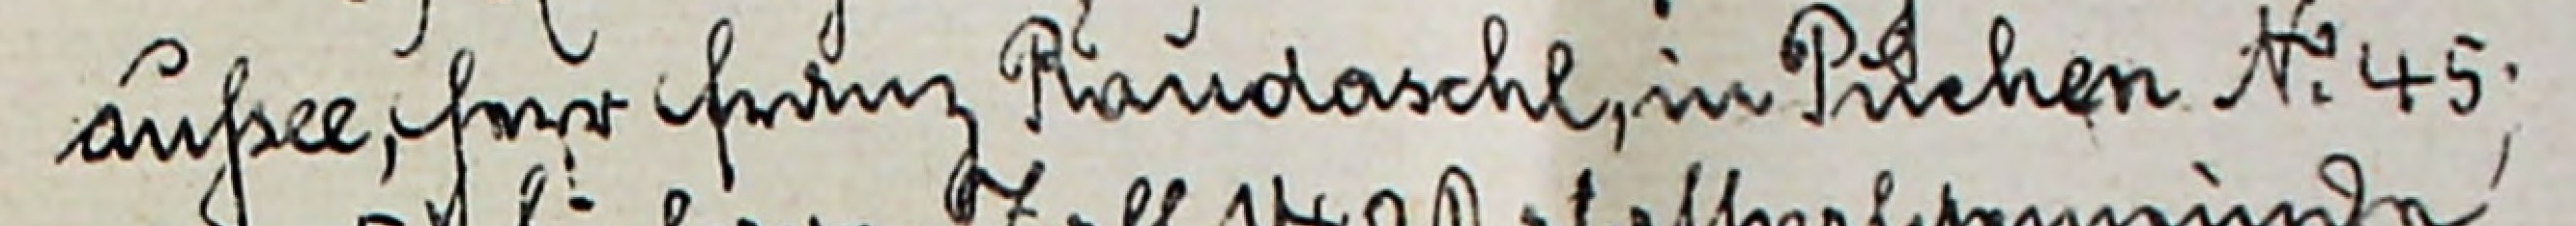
aussee, Herr Franz Raudaschl, in Puchen No 45;
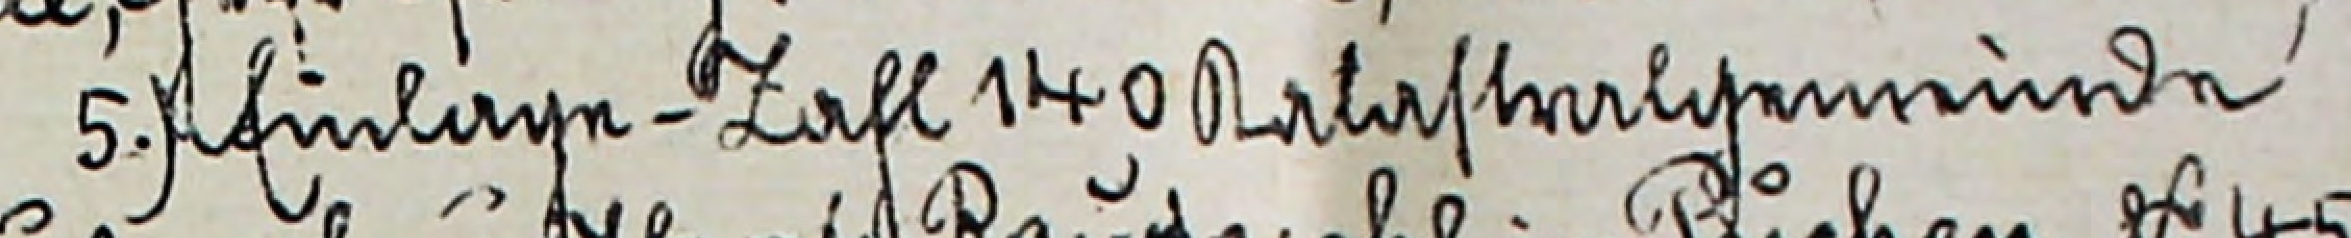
5.) Einlage - Zahl 140 Katastralgemeinde
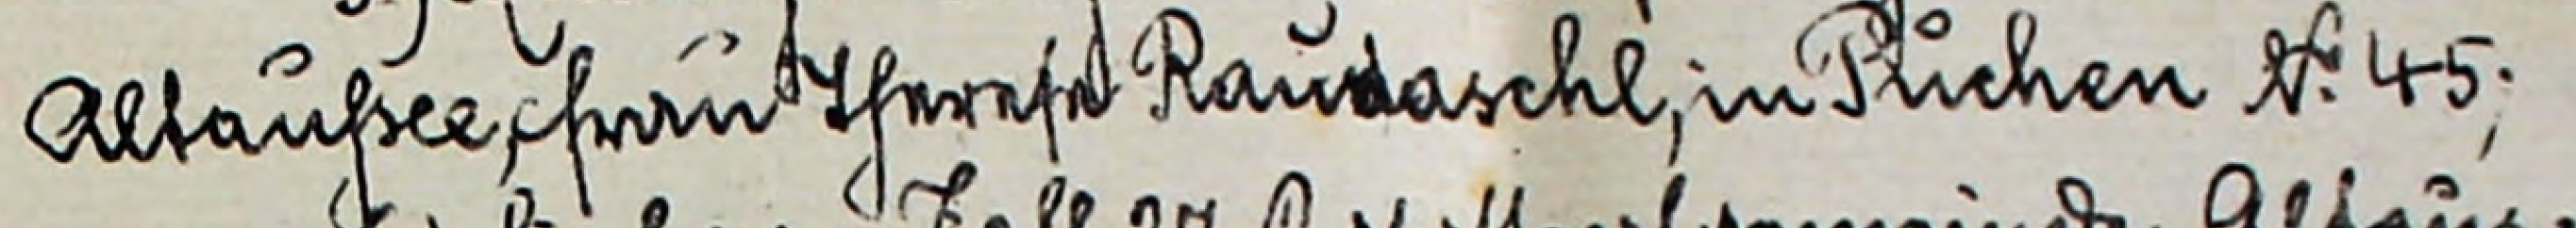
Altaussee, Frau Therese Raudaschl, in Puchen No 45;
